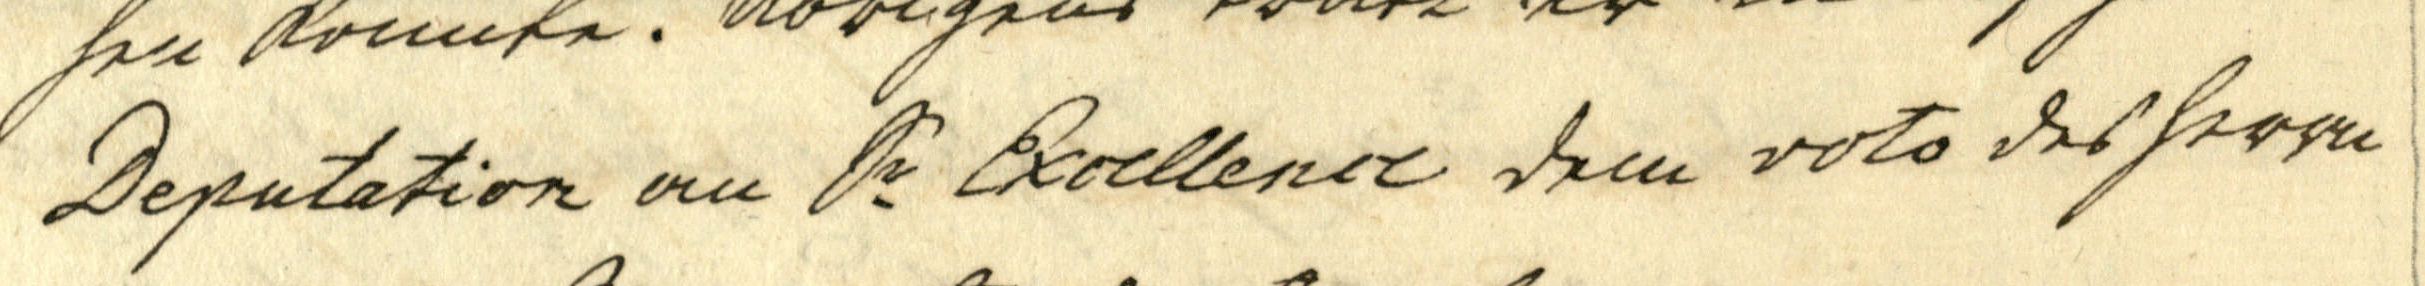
Deputation an Sr Excellence dem voto des Herrn
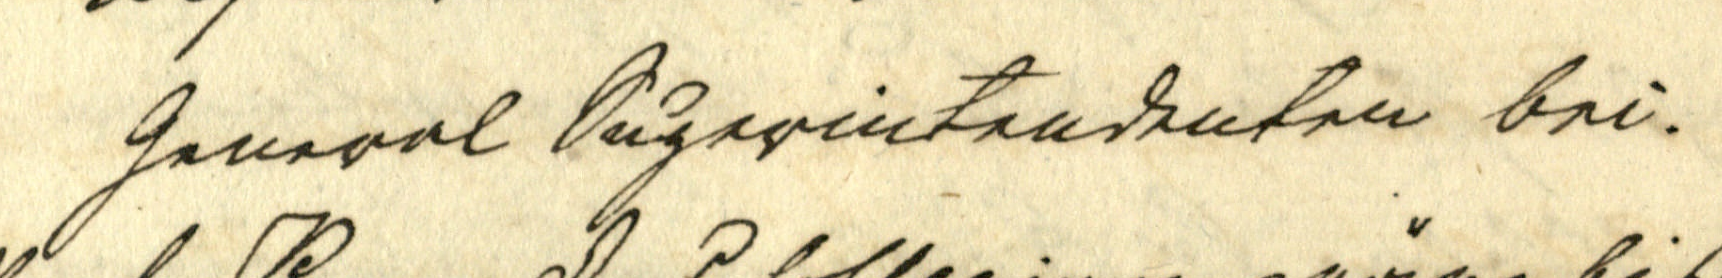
General Superintendenten bei.
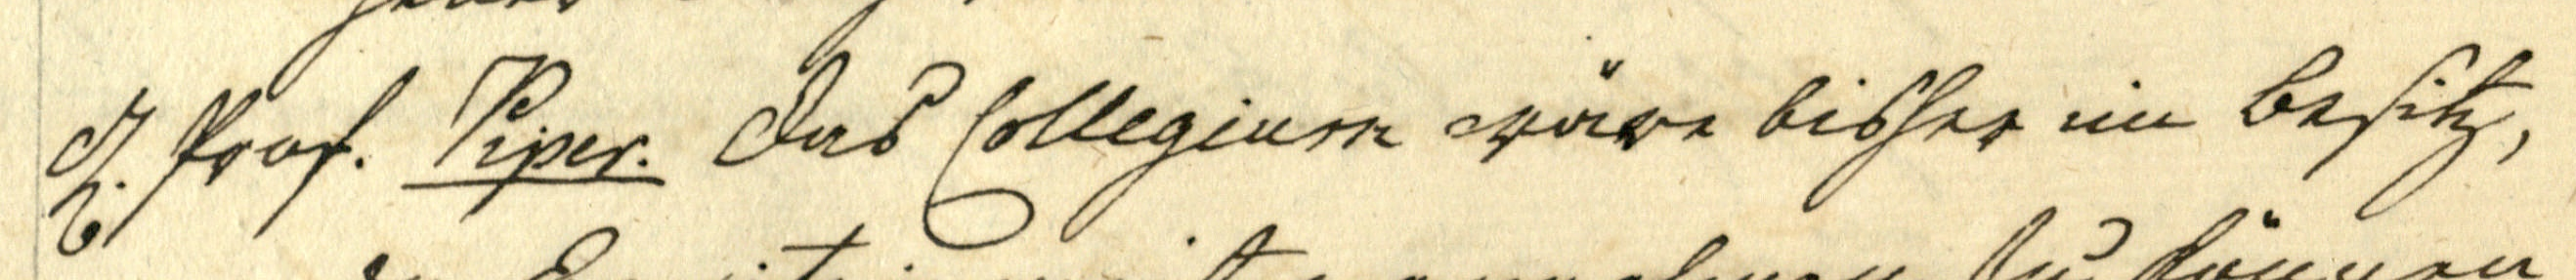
dh. Prof. Piper. Das Collegium wäre bisher im Besitz,
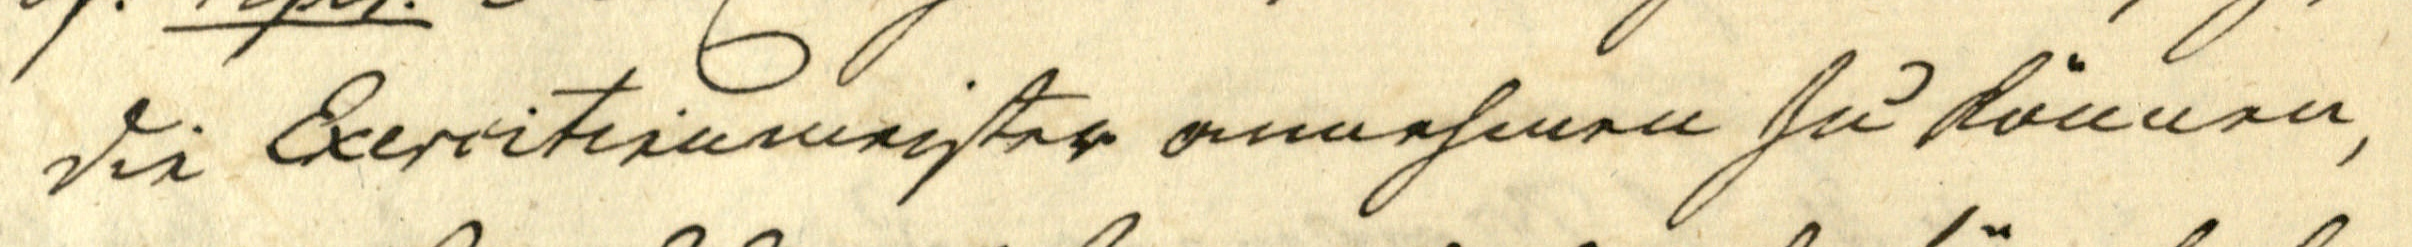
die Exercitienmeister annehmen zu können,
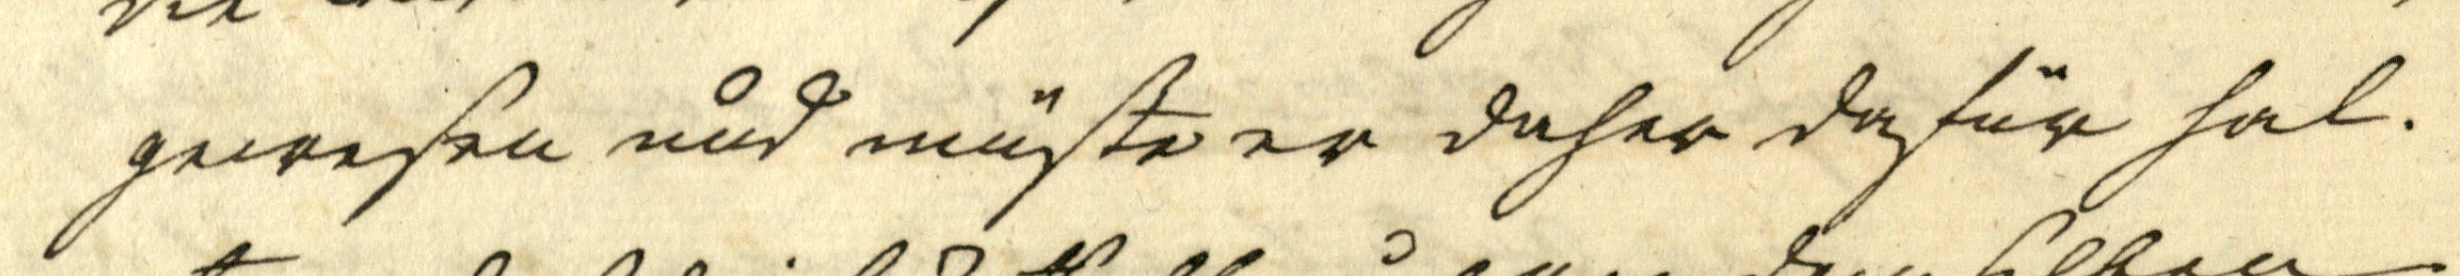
gewesen und müßte er daher dafür hal¬
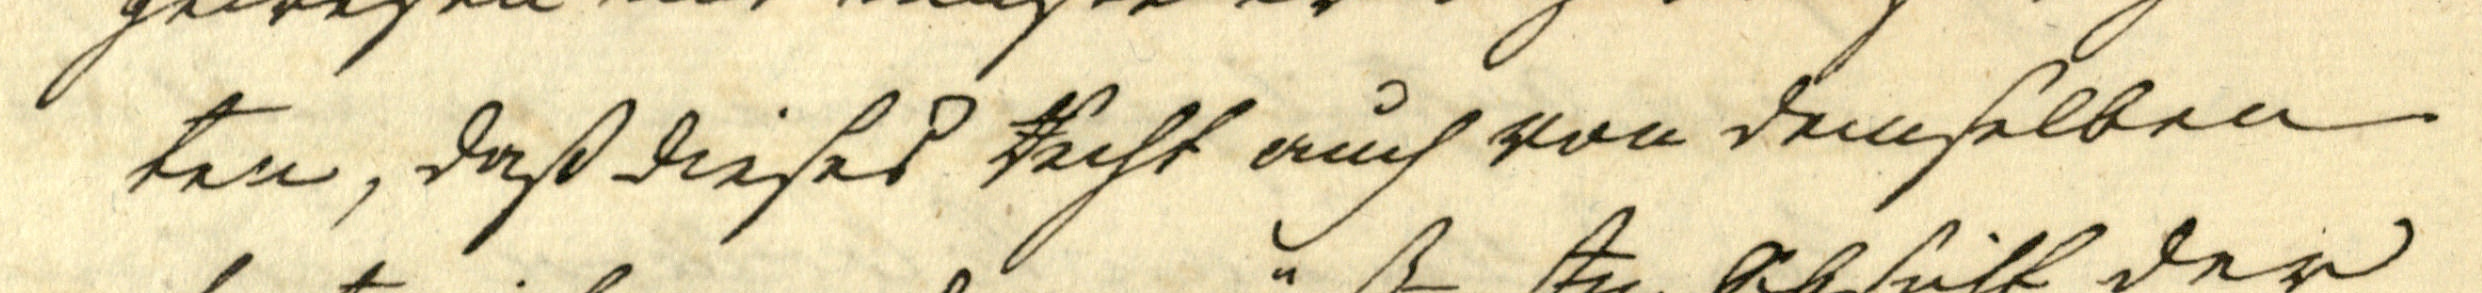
ten, daß dieses Recht auch von demselben
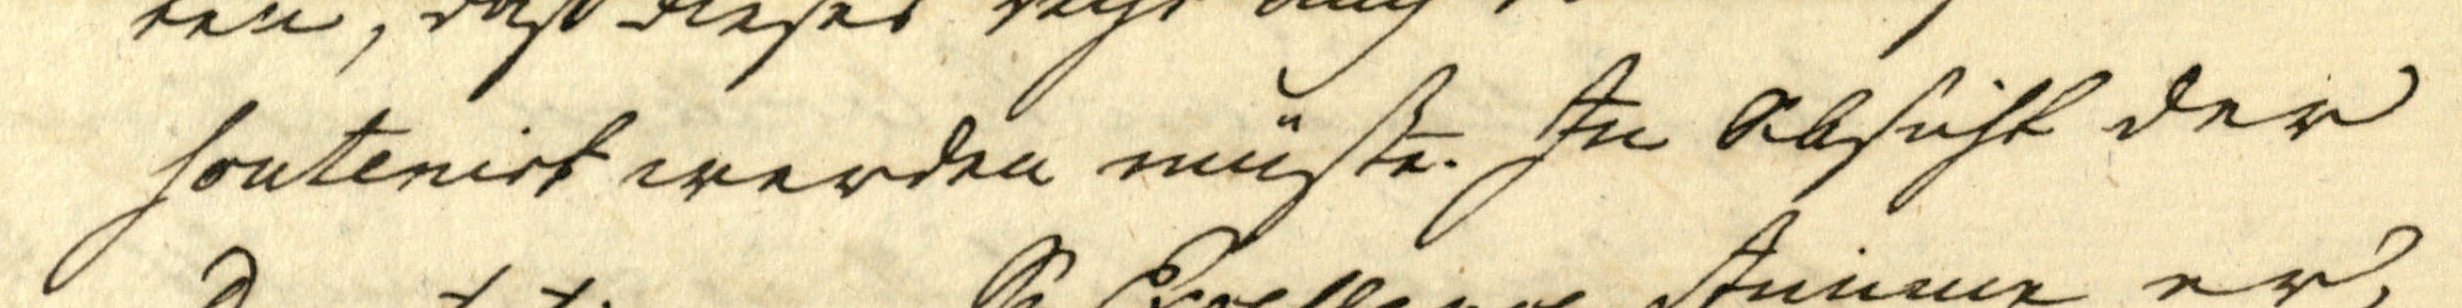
soutenirt werden müßte. In Absicht der
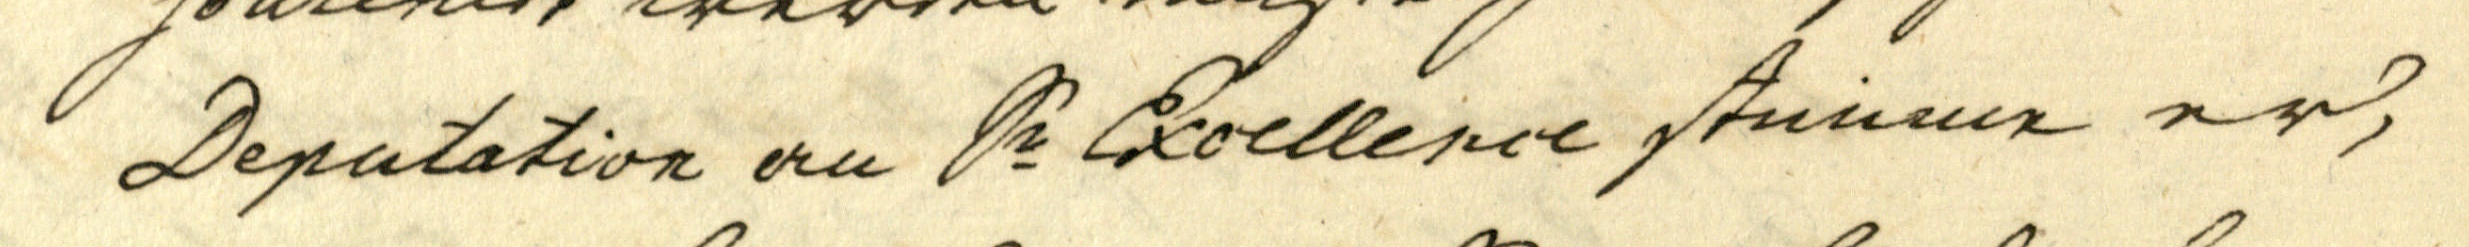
Deputation an Sr Excellence stimme er
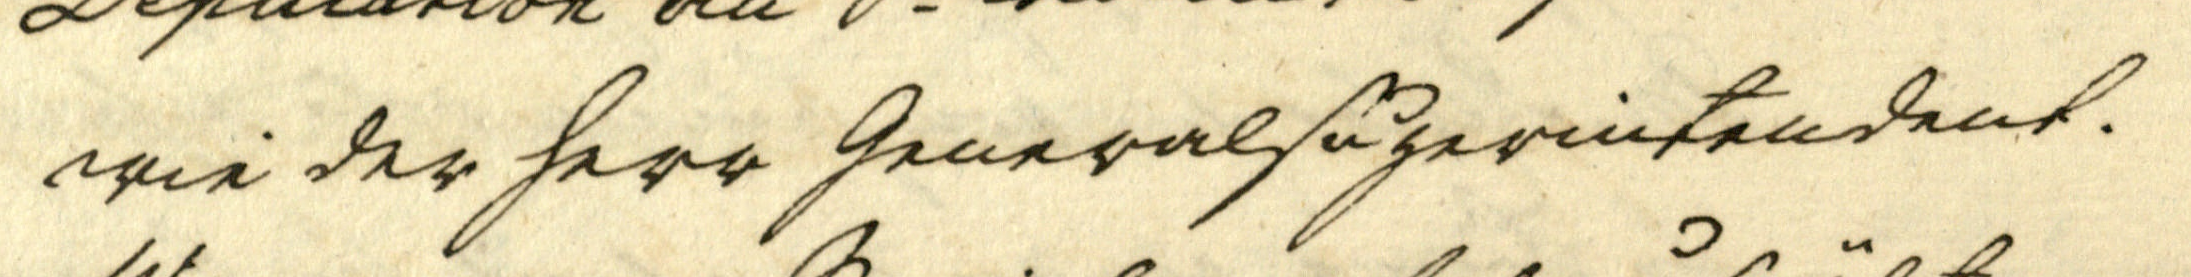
wie der Herr Generalsuperintendent.
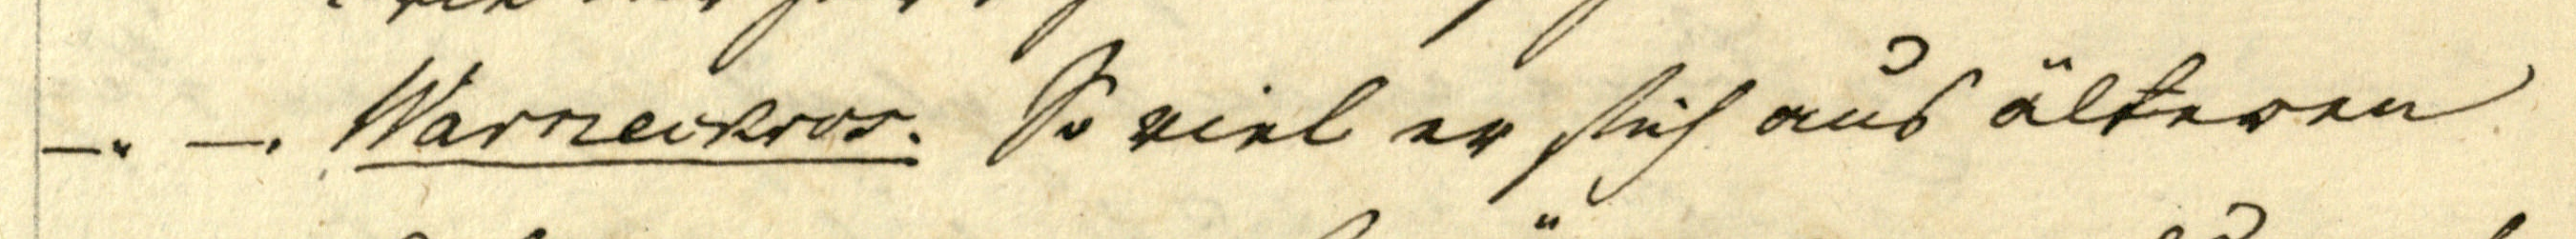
Warneckros. So viel er sich aus älteren
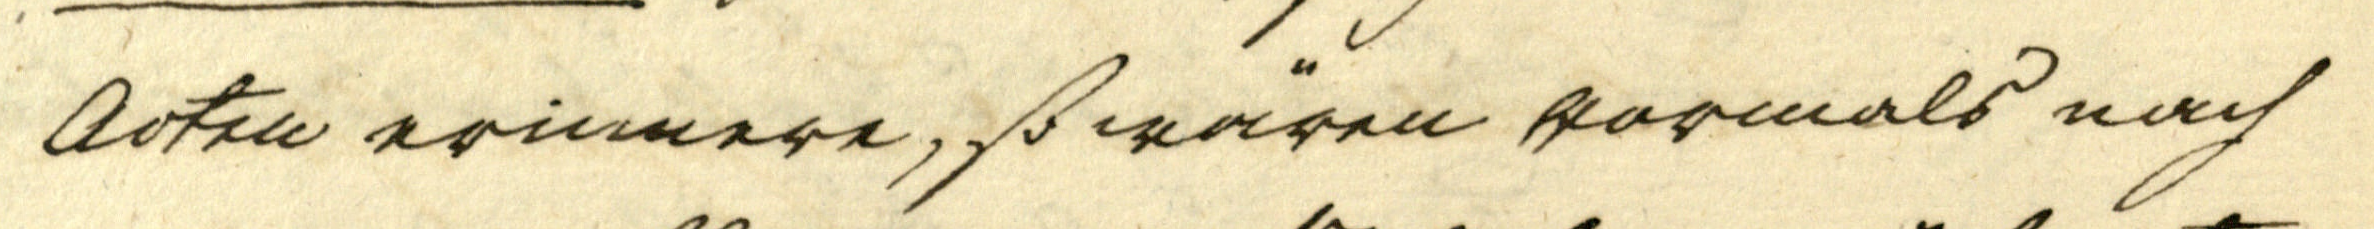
Acten erinnere, so wären vormals nach
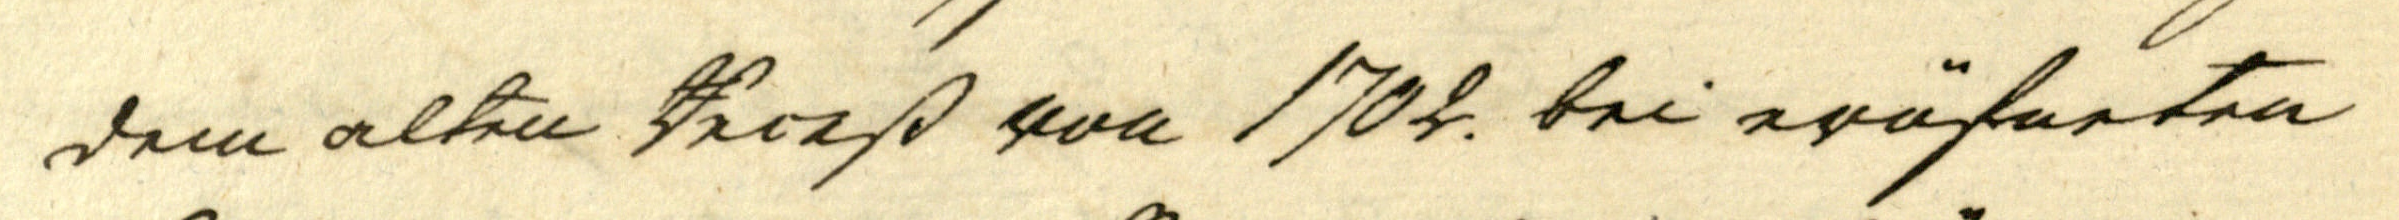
dem alten Receß von 1702. bei eröfneten
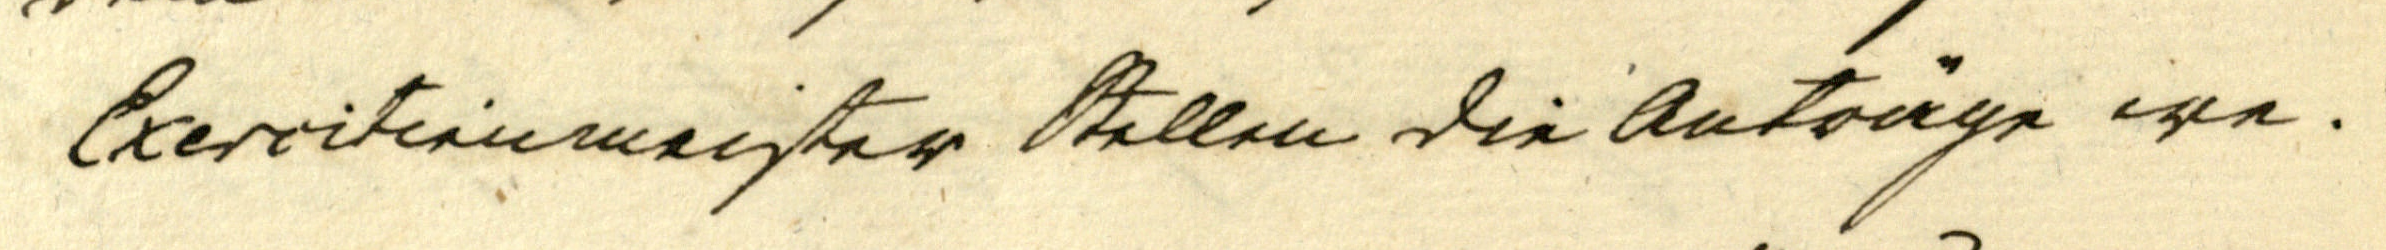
Exercitienmeister Stellen die Anträge we¬
